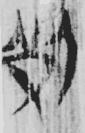死
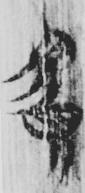賜
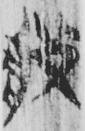○（葬）
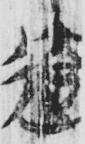迲（去）
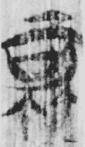○（苛）
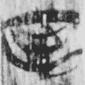匿（慝）
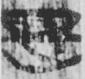是
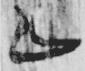㠯（以）
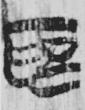爲
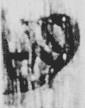名
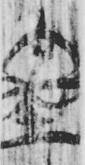○（禹）
